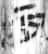百
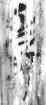事
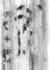訓（順）
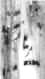城（成）
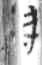邦
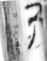君
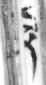○（得）
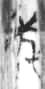年
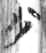少（小）
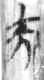夫
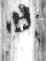四
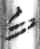㠯
